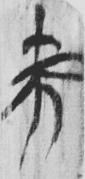夫
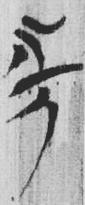先
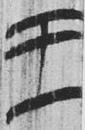王
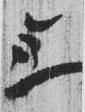之
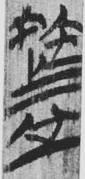箸（書）
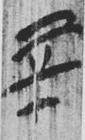不
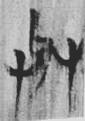與
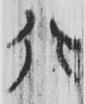北
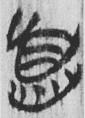面
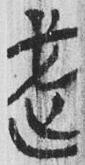武
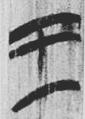王
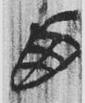西
